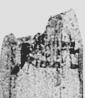於
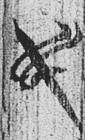民
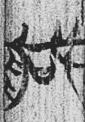戕（莊）
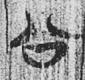公
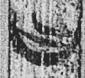曰
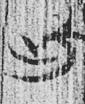此
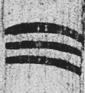三
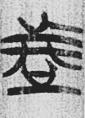者
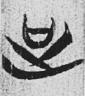足
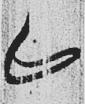㠯（以）
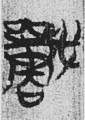○（戰）
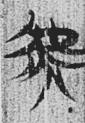{虍介}（乎）
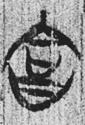合
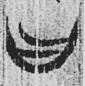曰
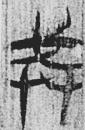戒
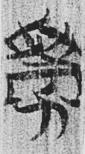{舛亼几力}（勝）
